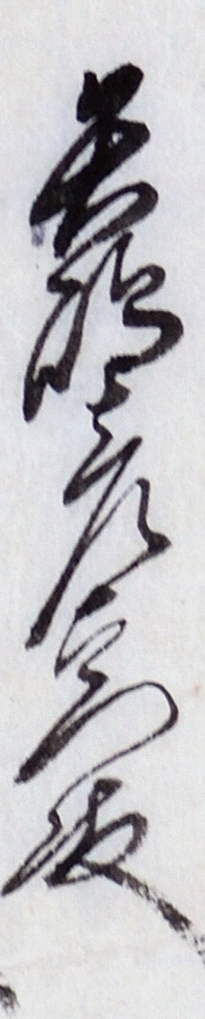矢嶋彦右衛門殿
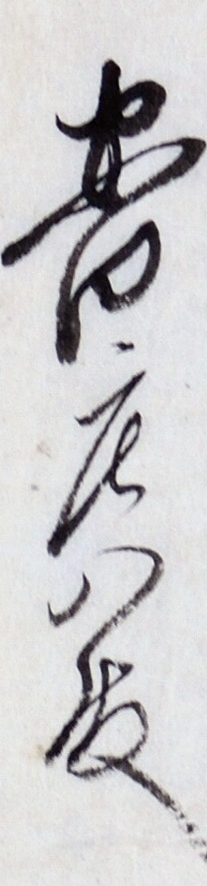安田庄八殿
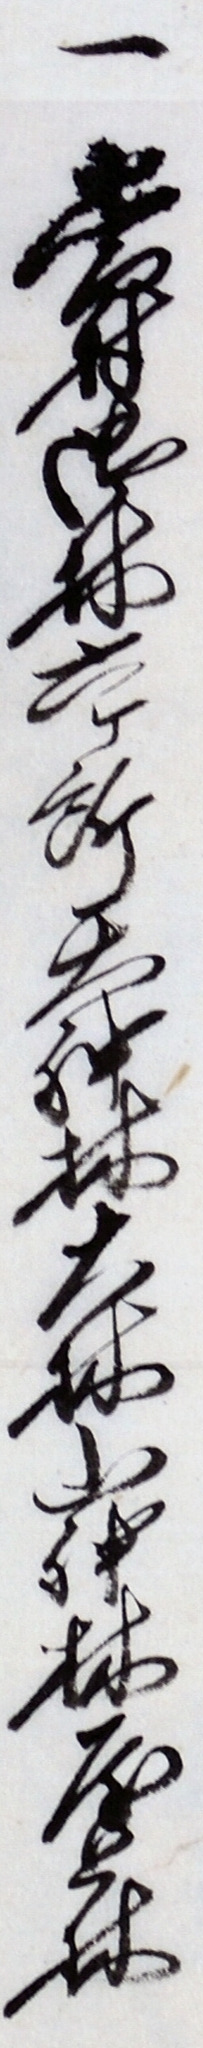一当村御林六ヶ所天神林大林山神林やと林
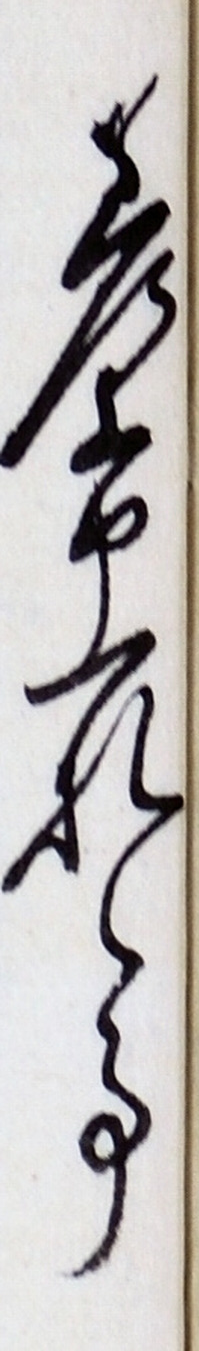差上申一札之事
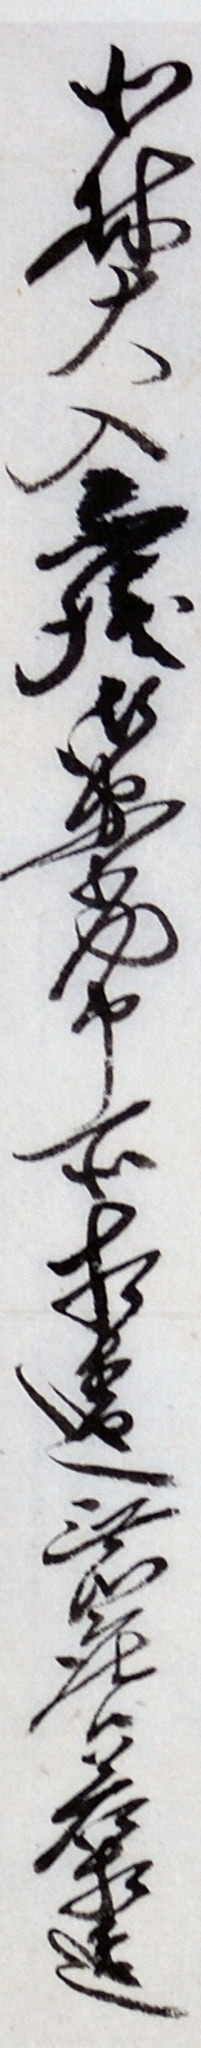北林大入不残御案内申所相違無御座候若相違
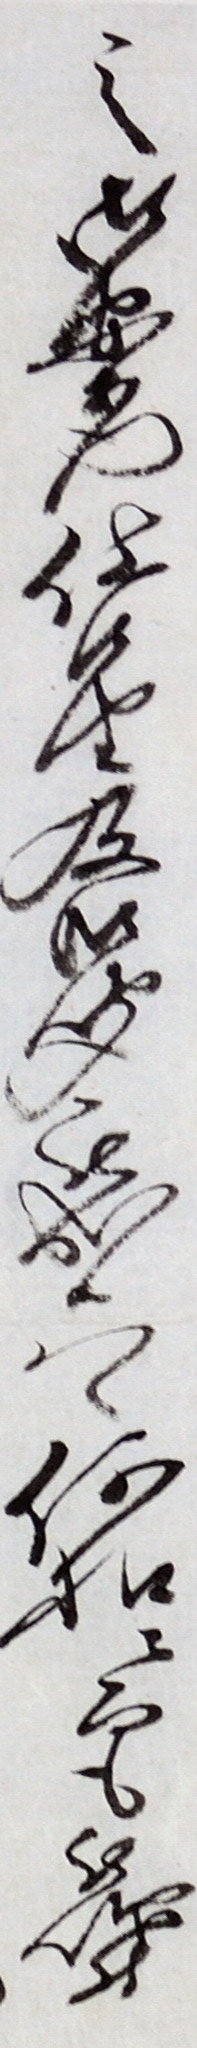之御案内仕候由及御聞被成候ハヽ何様ニ而も被仰付候事
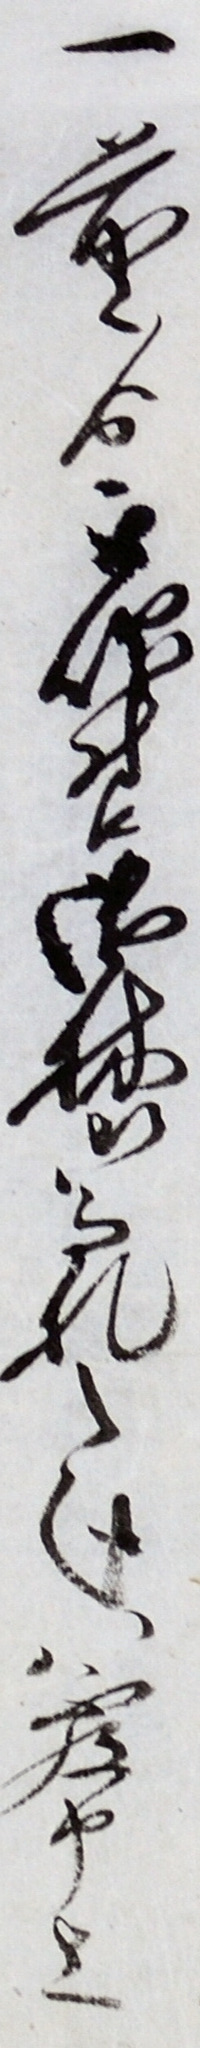一前々ゟ被仰付候御林御高札之趣ハ不及申上
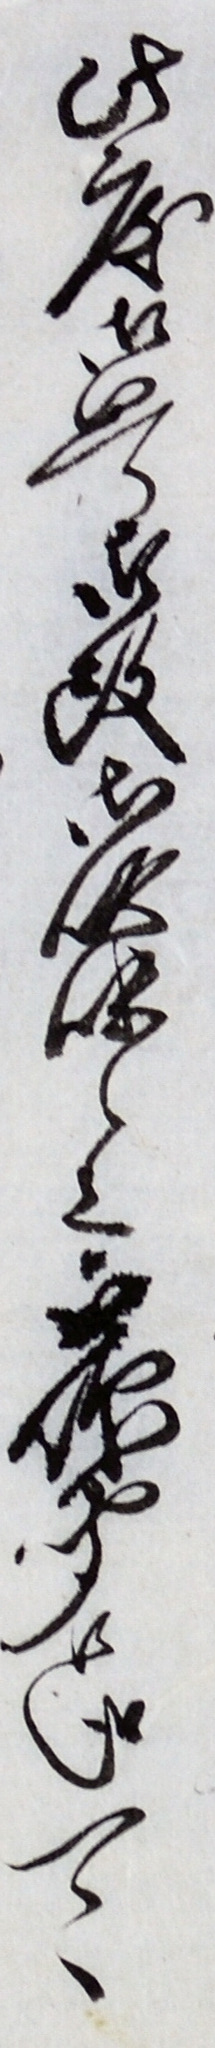此度御廻り御改御吟味之上被仰聞候趣一々
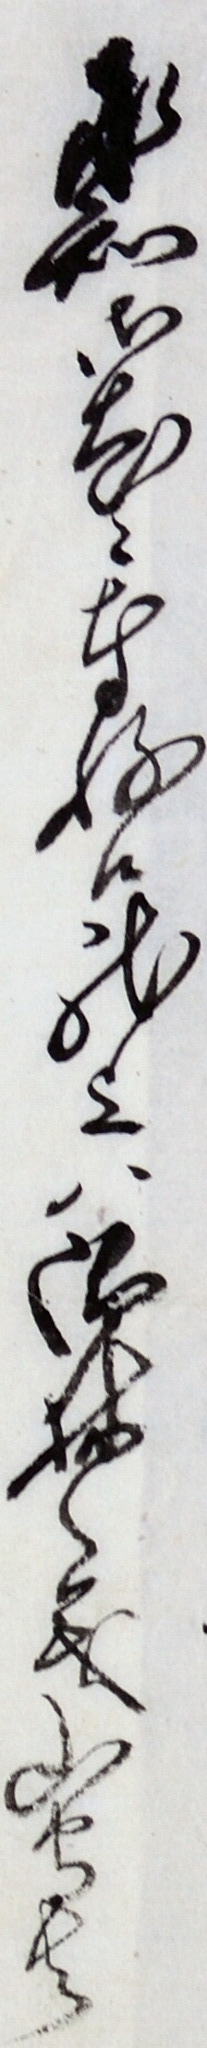承知御尤ニ奉存候然上ハ御林之義山守共
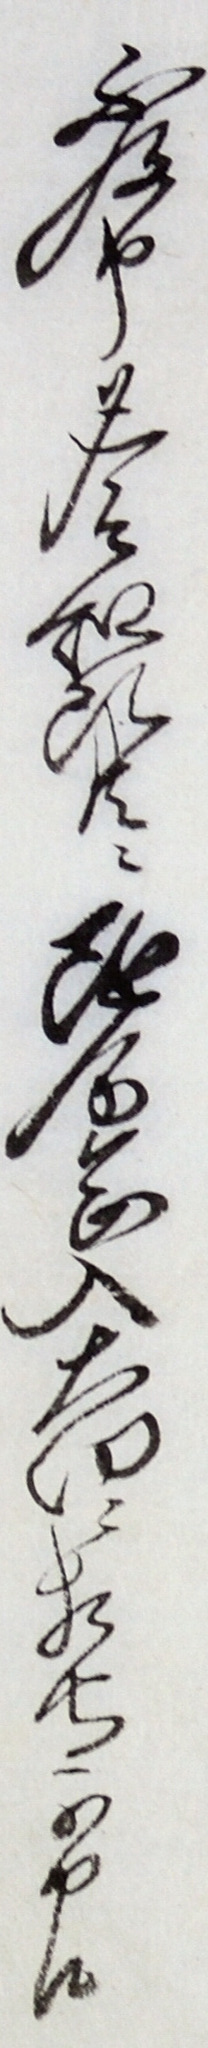不及申名主組頭共ニ随分念入大切ニ相守可申候

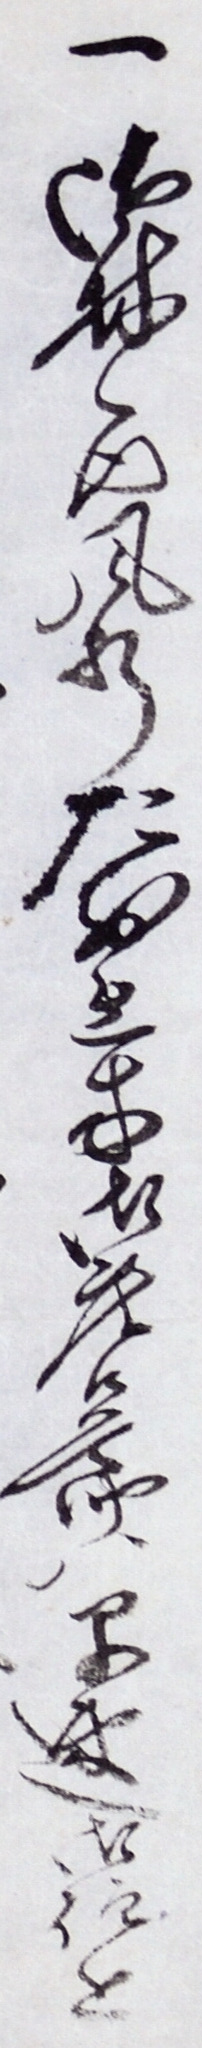一御林之内風折たおれ木御座候節ハ早速御注進
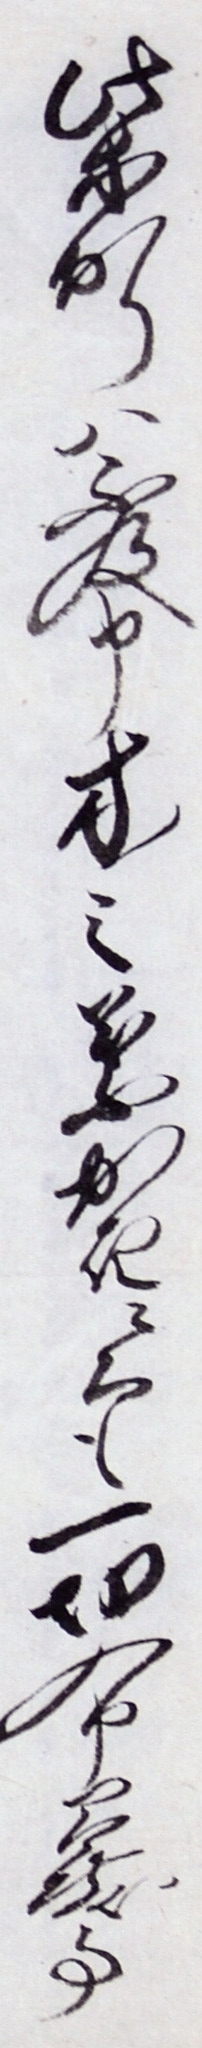柴かりハ不及申木之葉かきニ而も一切入申間敷事
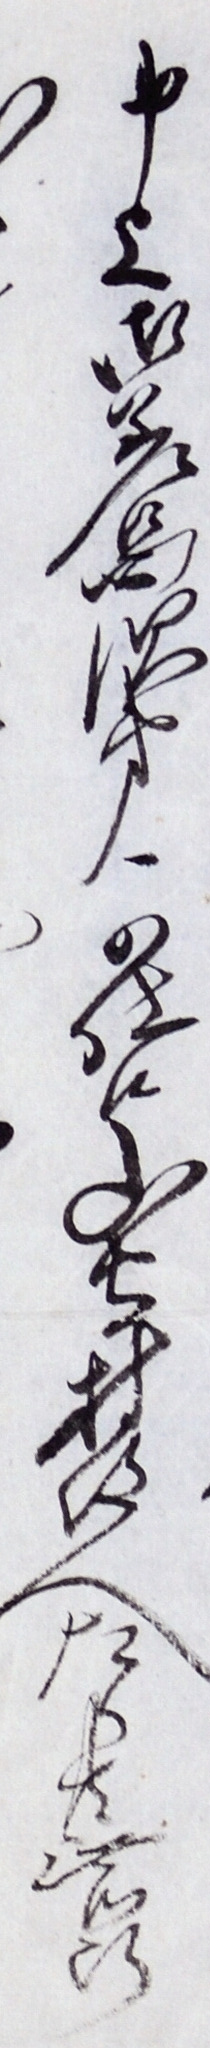申上御差図次第可仕候山守村役人たり共無御断
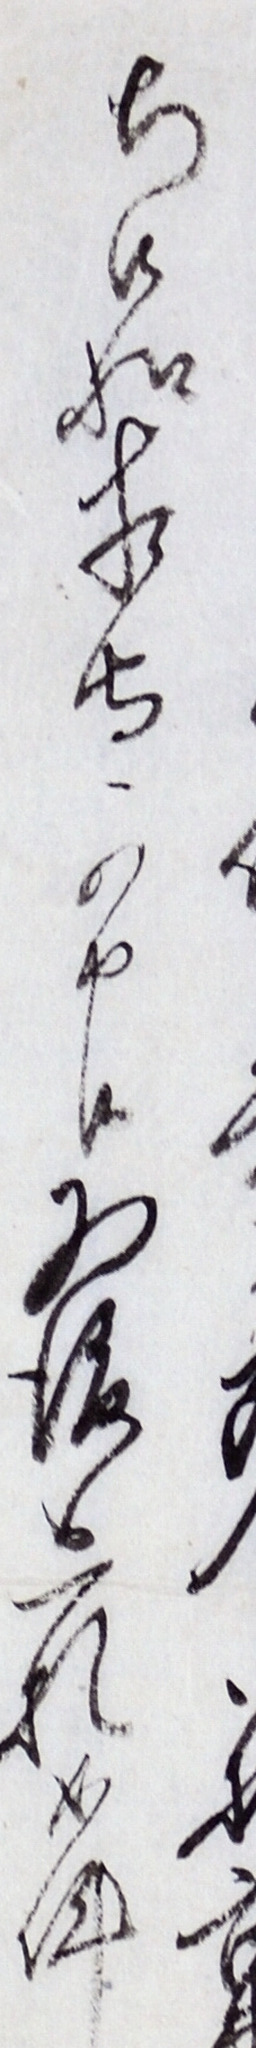ち候様相守可申候為後日一札如件
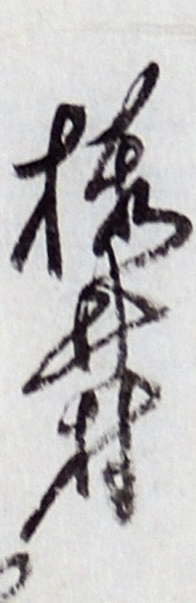桜井村
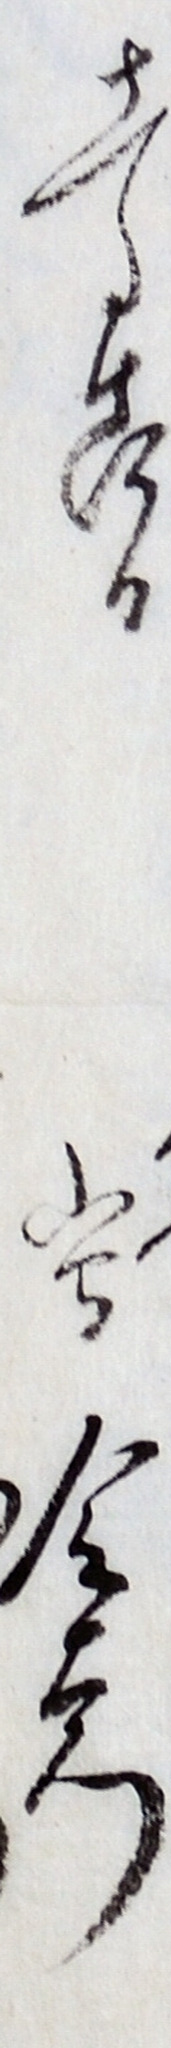十一月十四日山守金右衛門
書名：御林御竹藪証文控
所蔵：伊那市立高遠町図書館・合同会社AMANE
